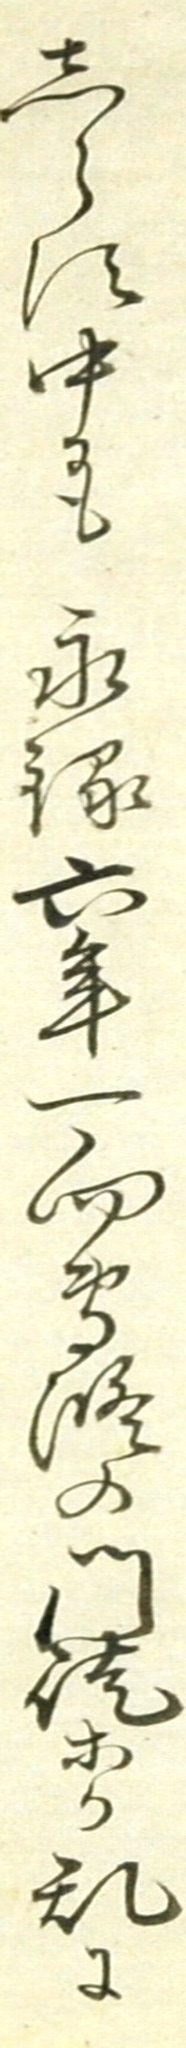しらす中にも永禄六年一向専修の門徒等か乱に
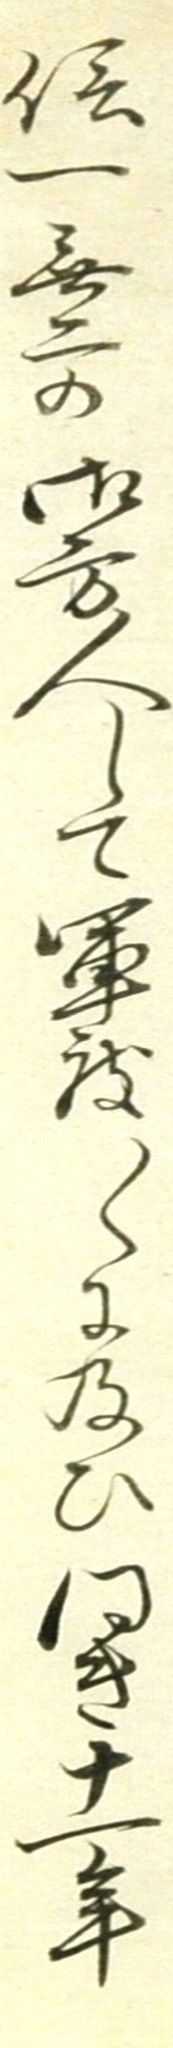信一無二の御方人して郡軍度〳〵に及ひ同き十一年
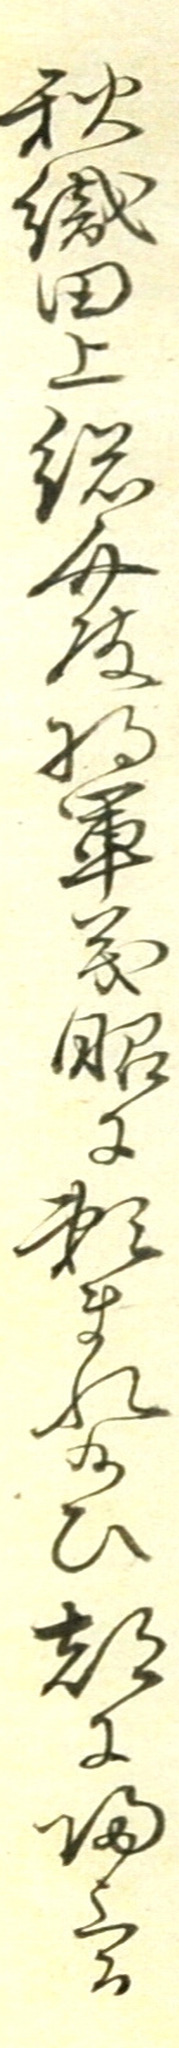秋織田上総介殿将軍義昭に頼まれ給ひ都に帰上る

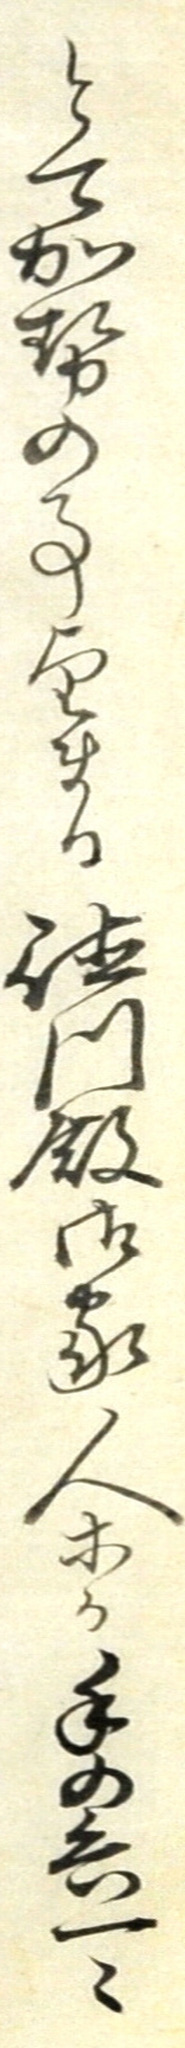とて加勢の事望まる徳川殿御家人等か手の兵一々
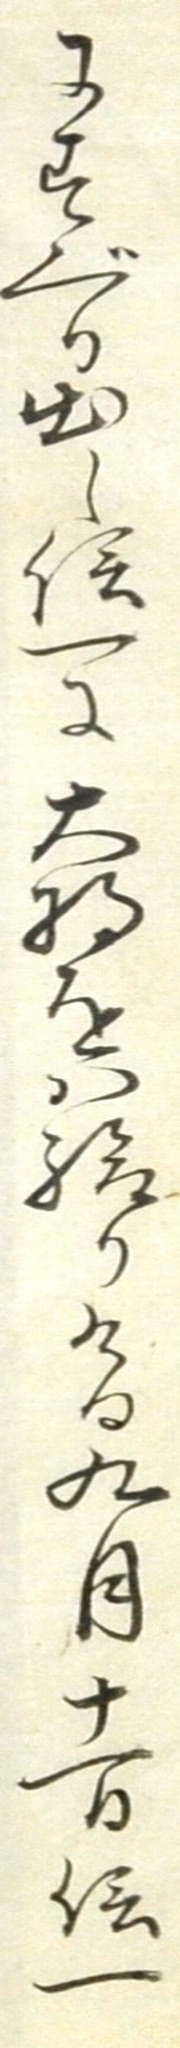にすぐり出し信一に大将をは給りける九月十一日信一
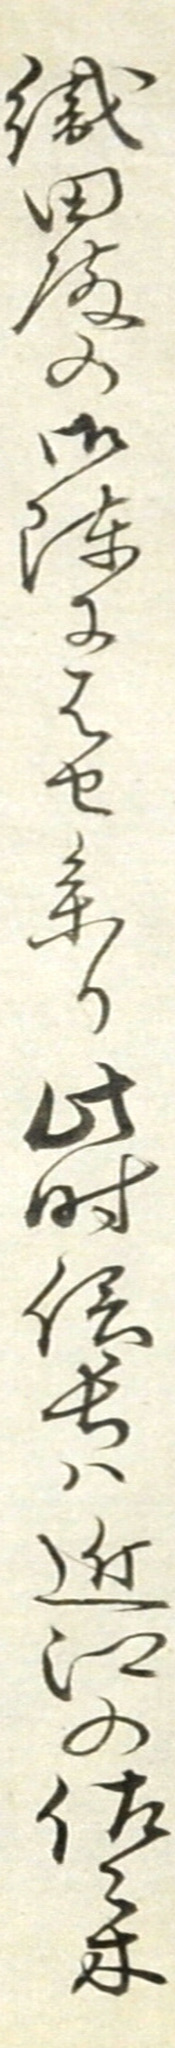織田殿の御陣にはせ参り此時信長は近江の佐々木
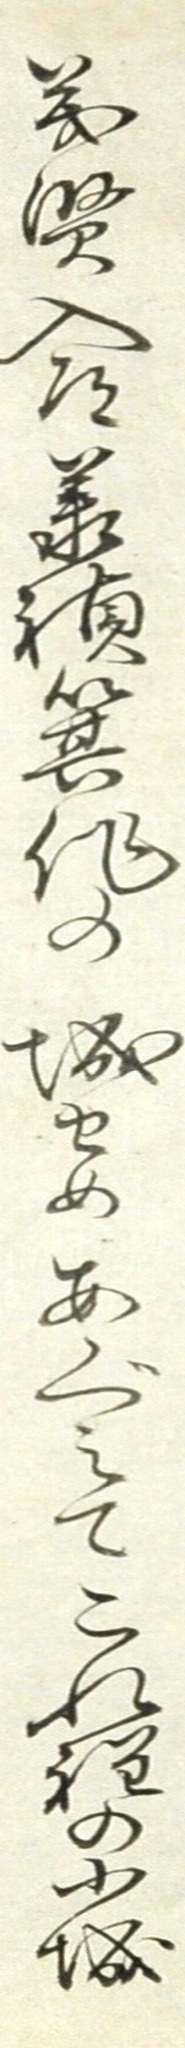義賢入道承禎箕作の城せめあぐみてこれ程の小城
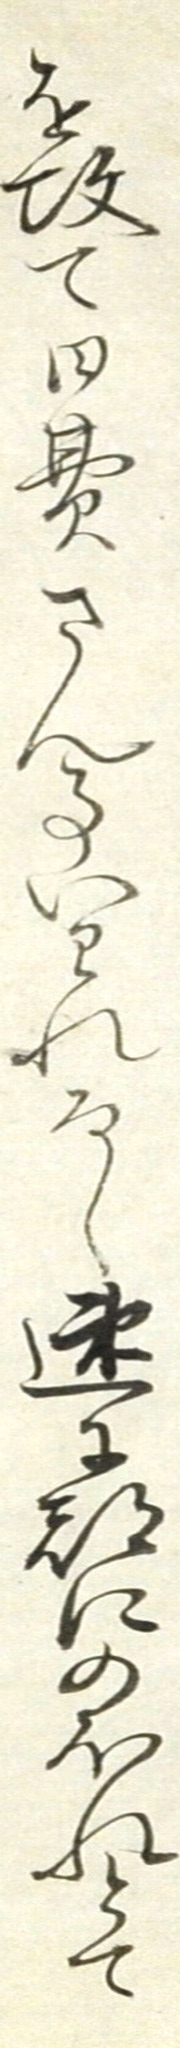を攻て日費さん事いわれなし速に都にのほれとて
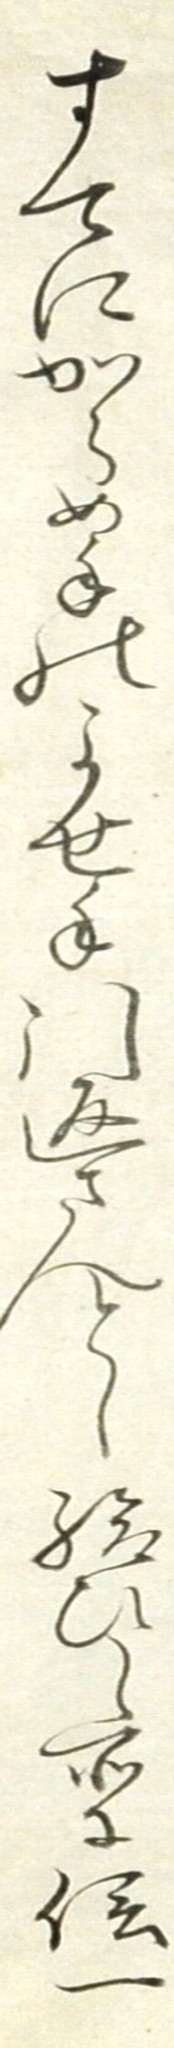すてにからめ手のよせ手引返さんとし給ひし所に信一
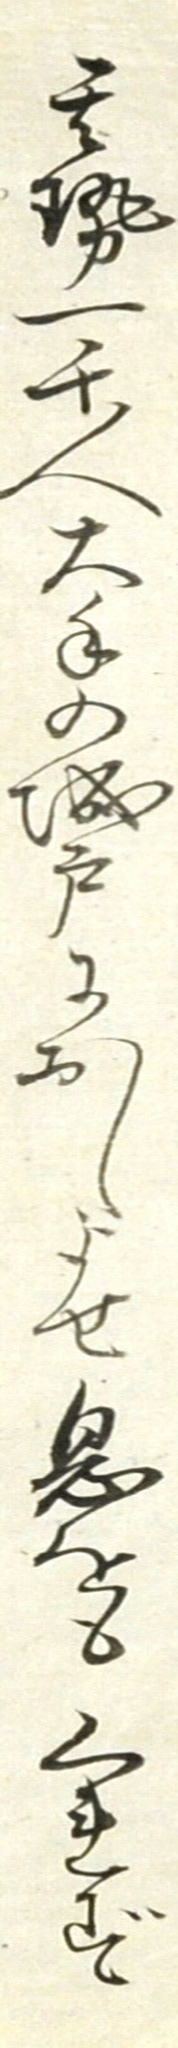其勢一千人大手の城戸におしよせ息をもくれず
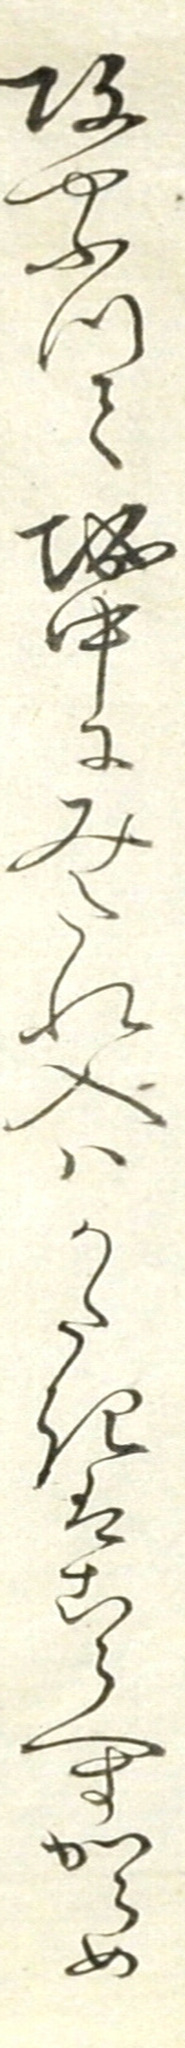攻やふつて城中にみたれ入はかたきはこらへすからめ
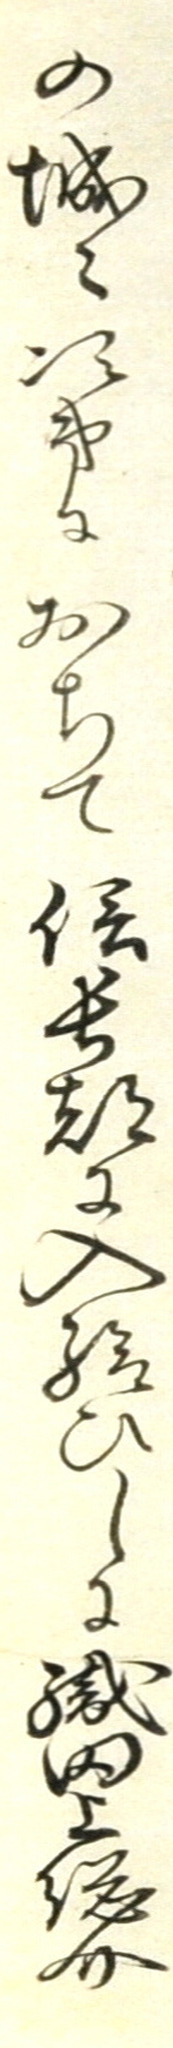の城々次第におちて信長都に入給ひしに織田上総介

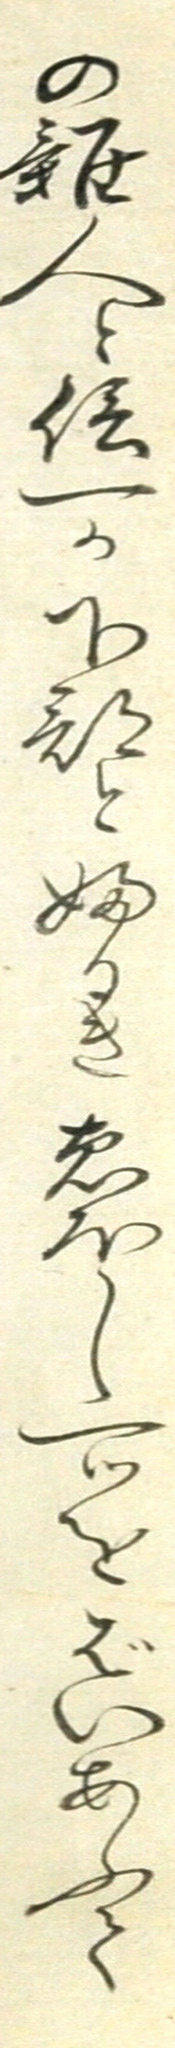の雑人と信一か下部とふるきゑほし一ッをばいあふて
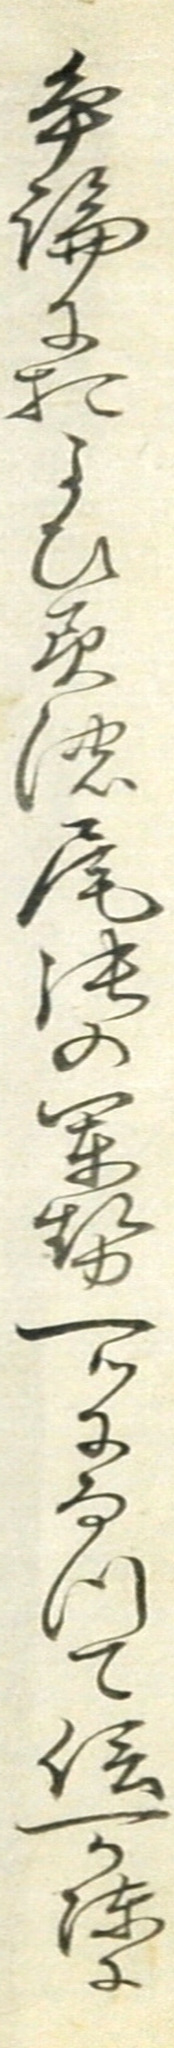争論におよひ美濃尾張の軍勢一ッになつて信一か陣に
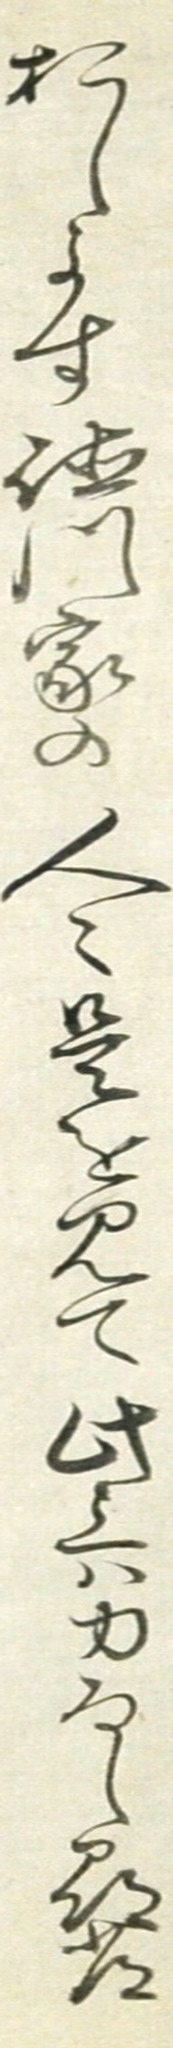おしよす徳川家の人々是を見て此上は力なし尋常
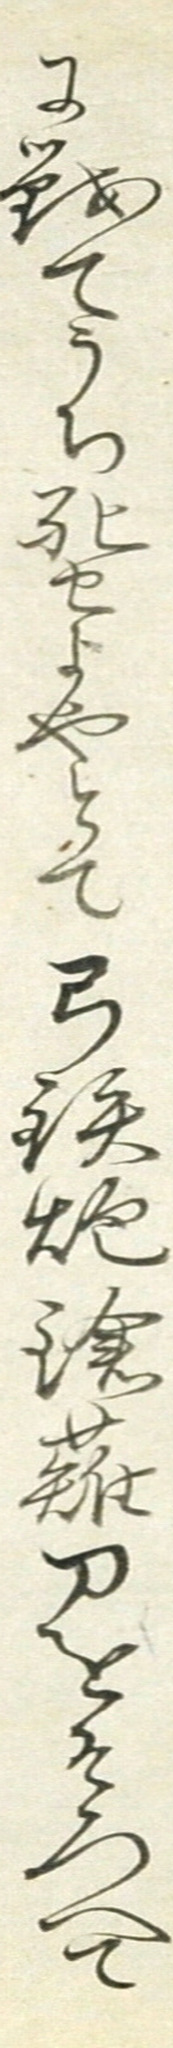に戦てうち死せよやとて弓鉄炮鎗薙刀をそろへて
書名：藩翰譜（二・三）
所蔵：伊那市立高遠町図書館・合同会社AMANE
